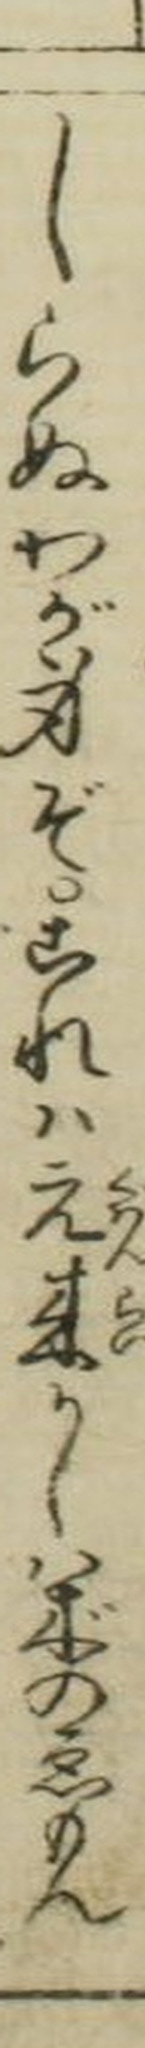しらぬわが身ぞ◯これは元来かしはぎのゑもん
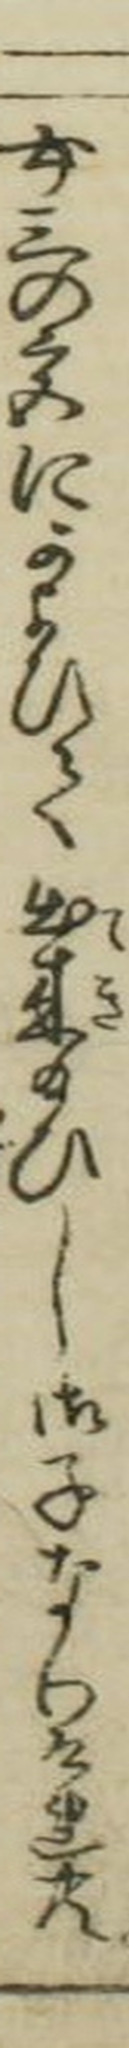女三の宮にかよひて出来給ひし御子なりけれ共。
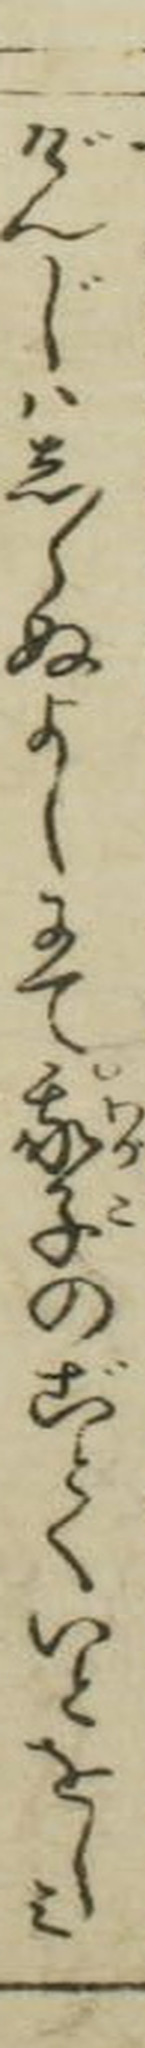げんじはしらぬよしにて。我子のごとくいとをしみ
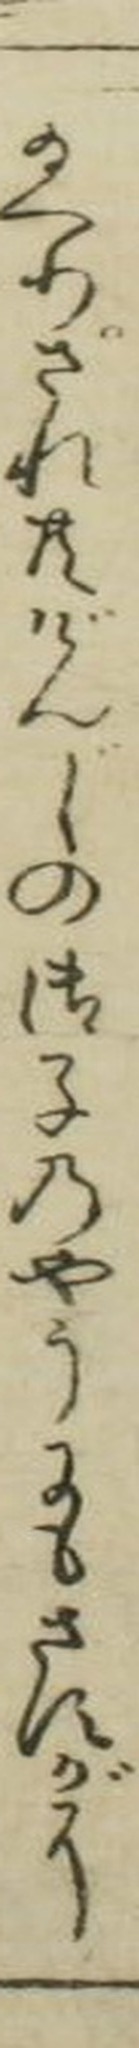給へり。され共げんじの御子のやうにもさすがに
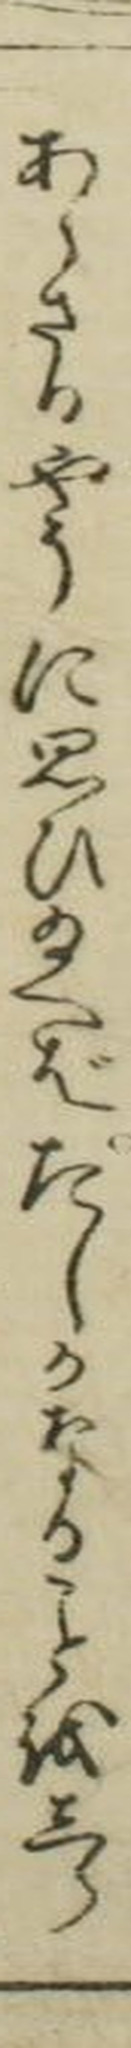あらさるやうに思ひ給へば。たしかなることをしら
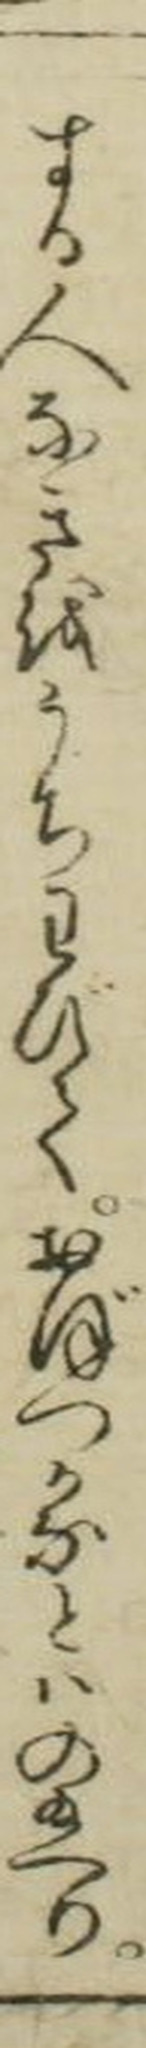する人なきをうちわびて。おぼつかなとはの給へり。
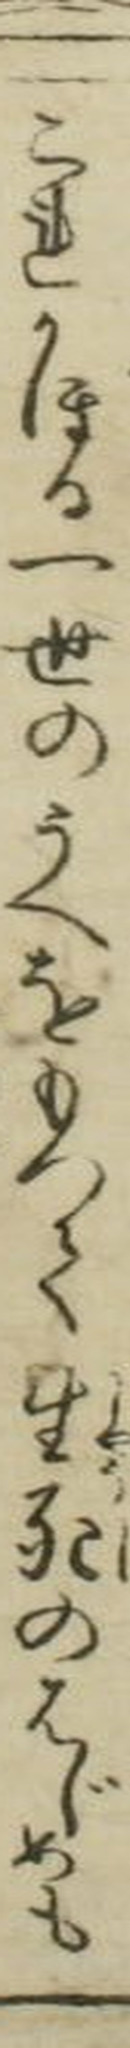これかほる一世のうへをもつて生死のはじめも
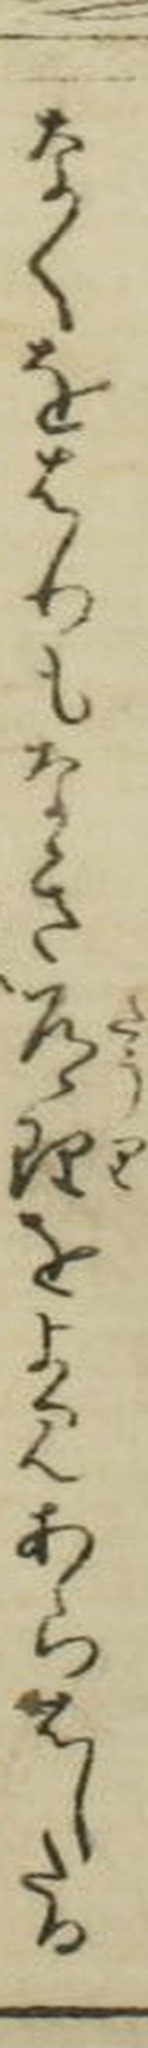なくをはりもなき道理をよみあらはしたる
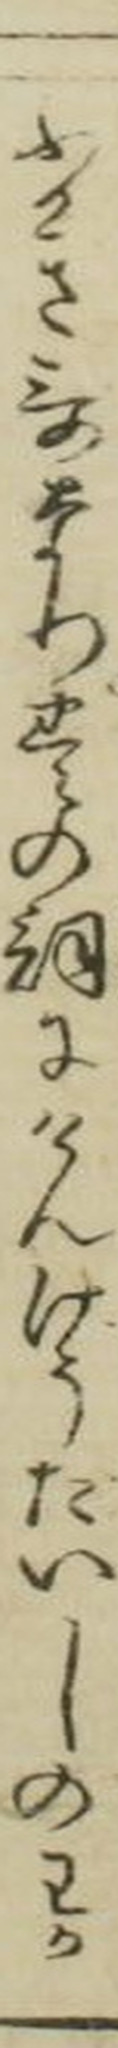ふかき哥なり。巻の詞にけんげうだいしのわか
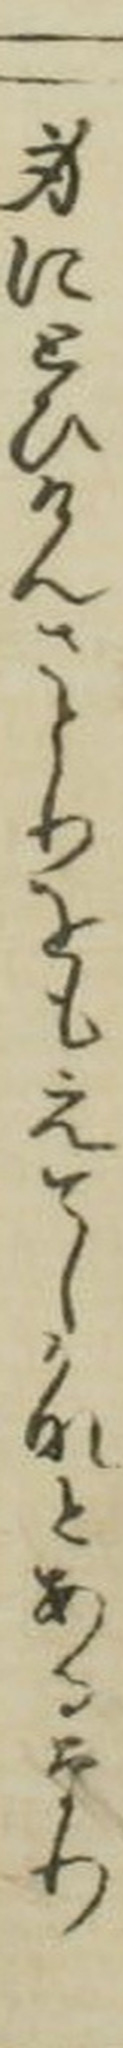身にとひけんさとりをもえてしかなとあるなり
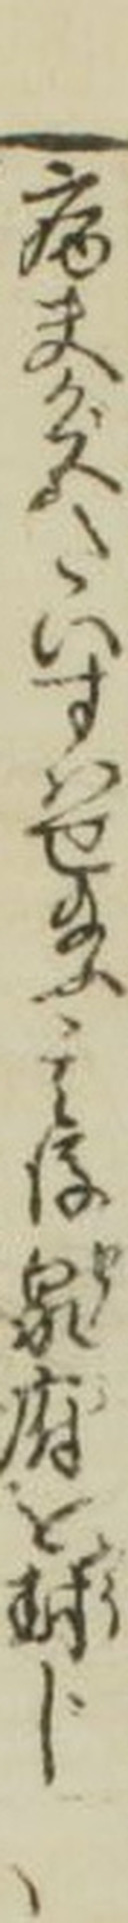病夫が五たいすはせ給ふ其後泉府を封じ
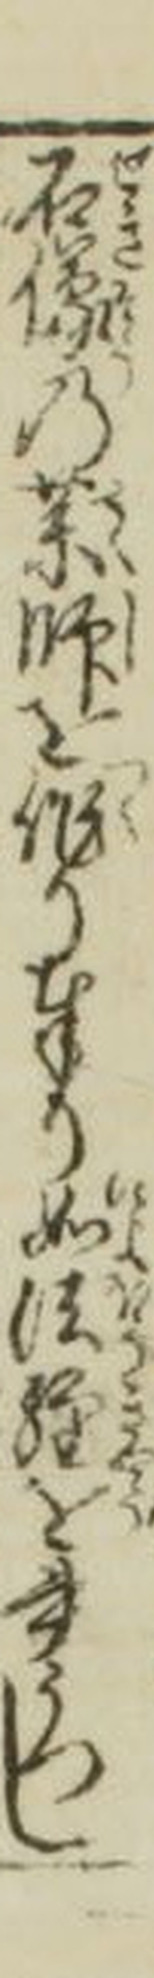石像の薬師を作り奉り如法経を書うつし
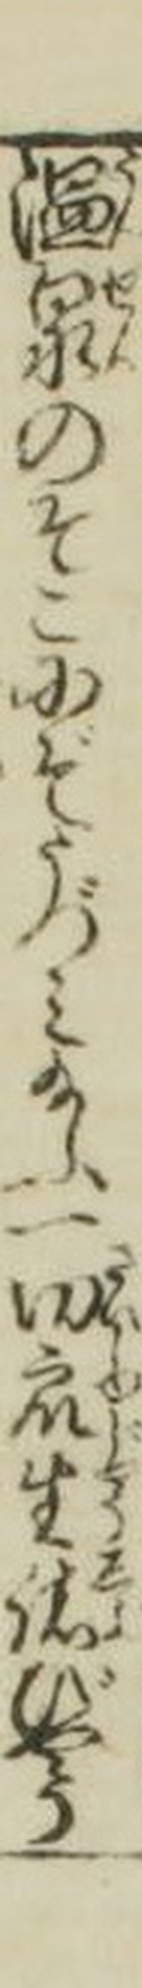温泉のそこにぞうづみ給ふ一切衆生諸びやう
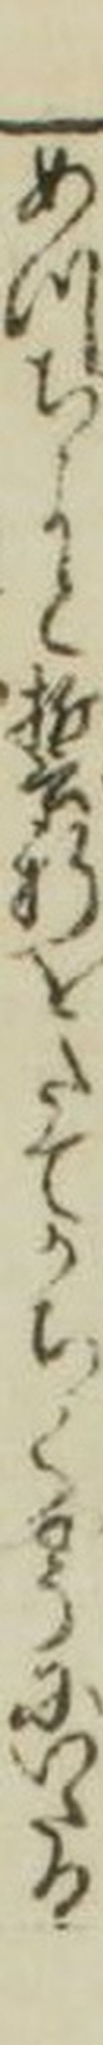めつぢよと誓祈をたてかちくやうにいたる
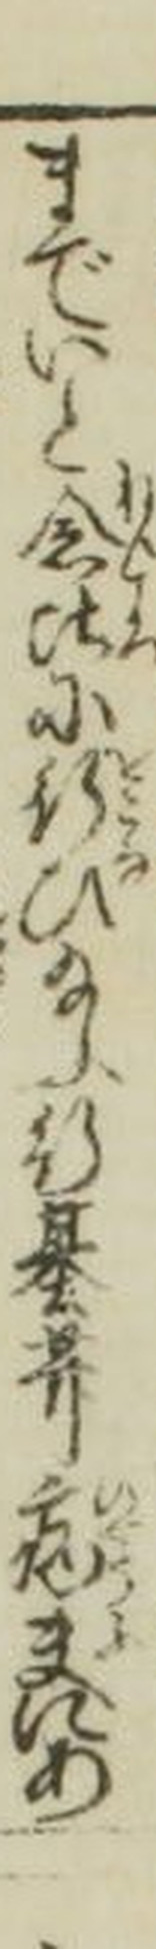までいと念比に行ひ給ふ行基菩薩病夫にあ
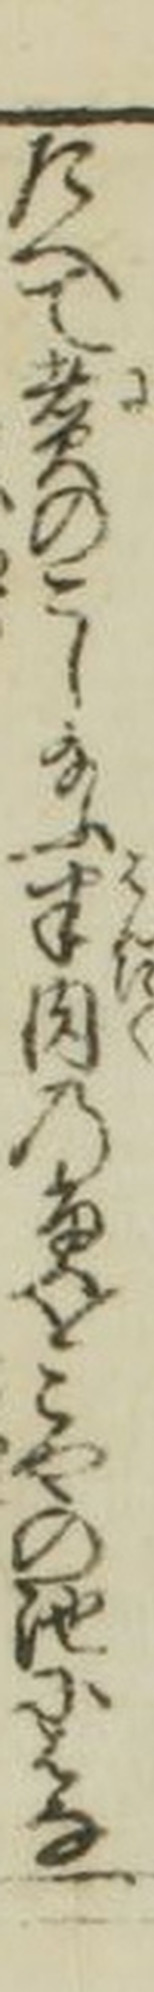たへて煮のこし給ふ半肉の魚をこやの池にはな
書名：女源氏教訓鑑
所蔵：東京学芸大学附属図書館
